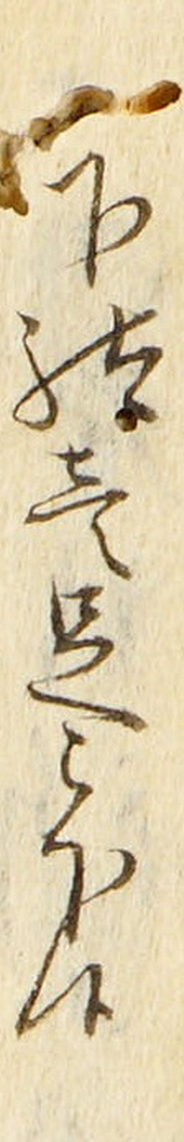下駄壱足も下候
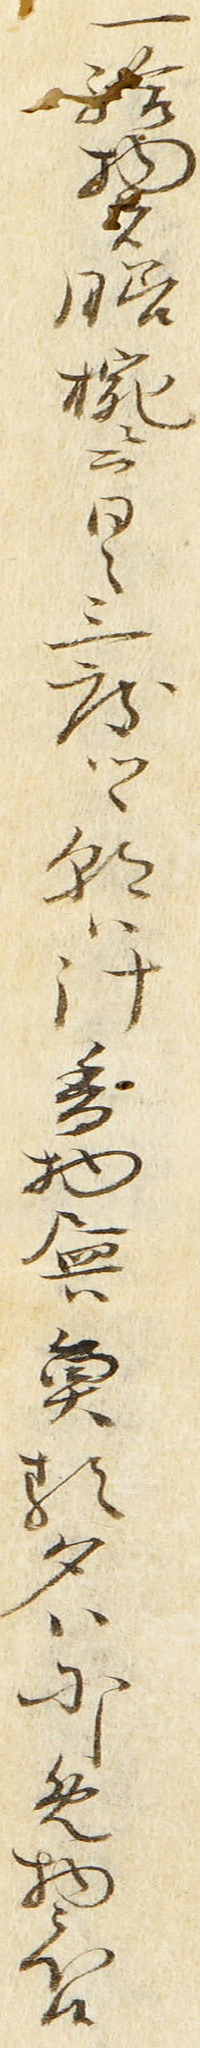一給物は膳椀に而日々三度ツツ朝は汁香物昼は魚類夕はにしめ物被下候
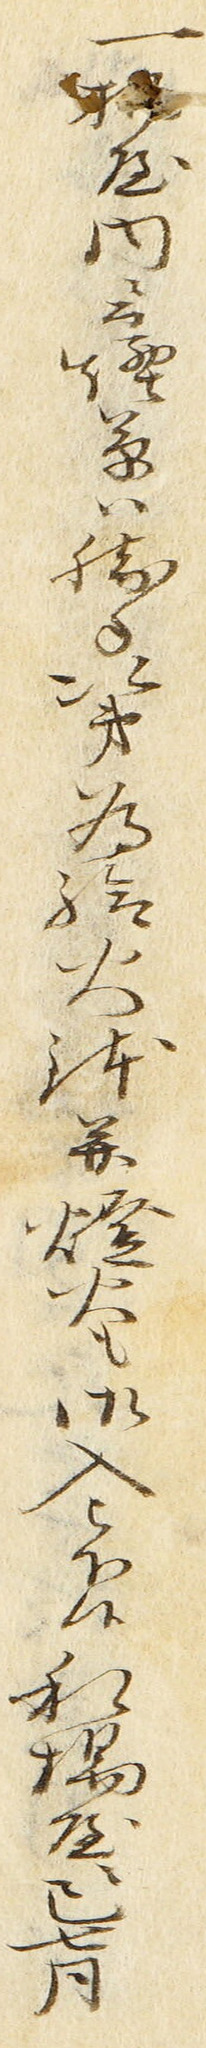一揚屋内に而煙草は勝手次第為給火躰並燈火も御入被下候私揚屋に巳七月
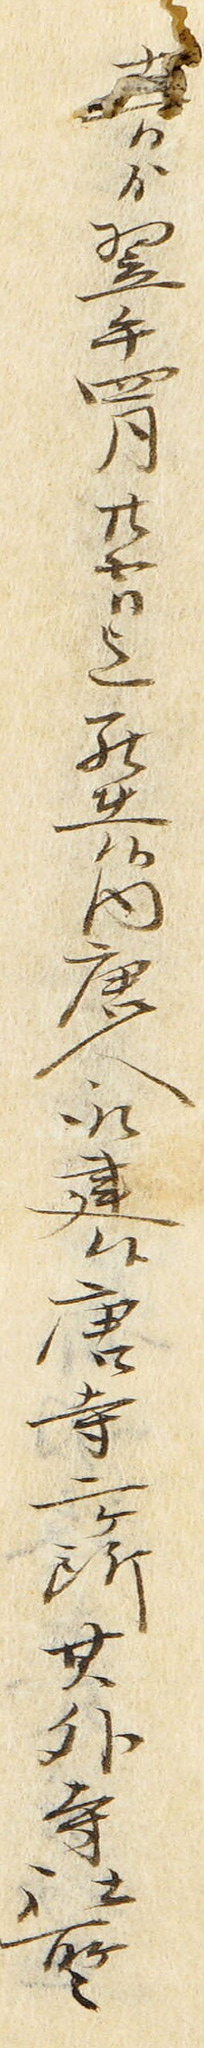十？日ゟ翌午四月廿七日迠罷在候内唐人被建候唐寺二ケ所其外寺社所々
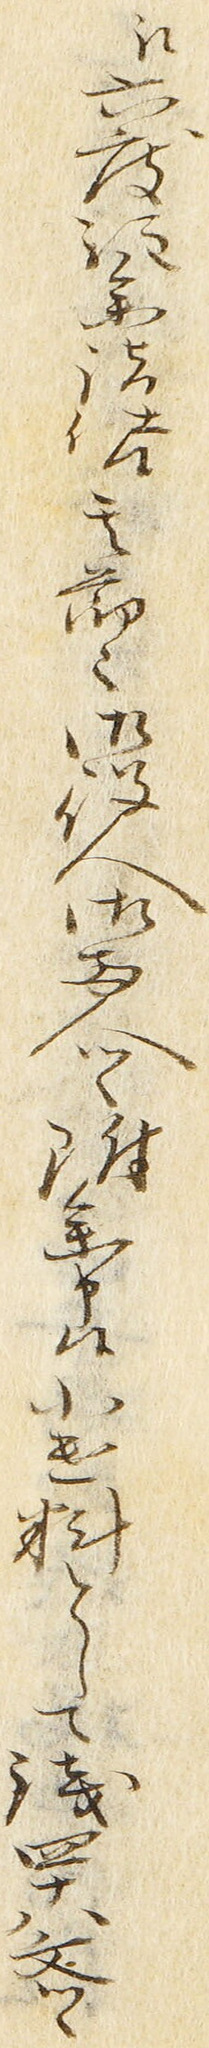被六度程参詣仕候其節節御役人御両人つつ附参申候小遣料として銭四十八文ツツ
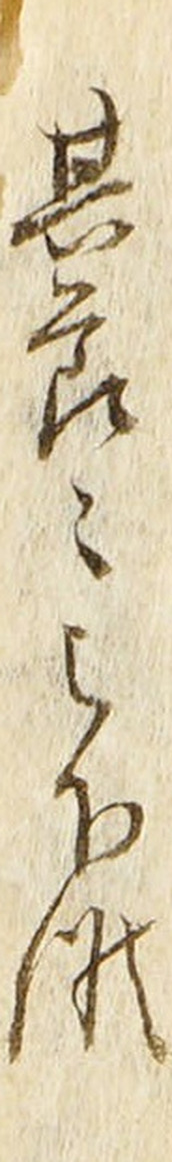其節に被下済
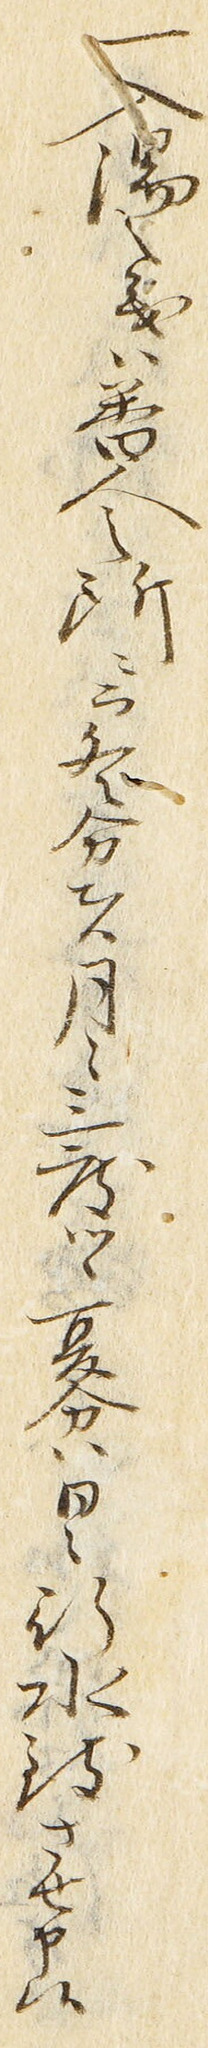一入湯之義は番人之所に而各々分は月々三度ツツ夏分は日々行水致させ申候
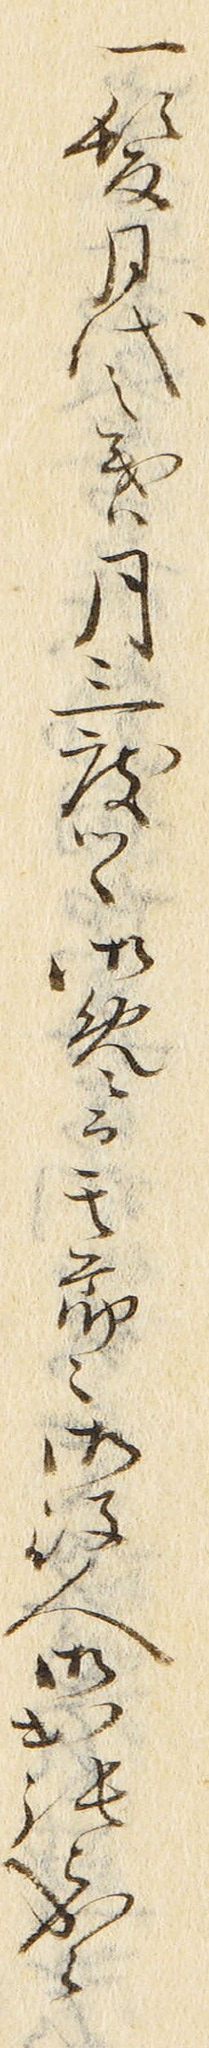一髪月代之義は月三度ツツ御免に而其節に御役人御出張被成候
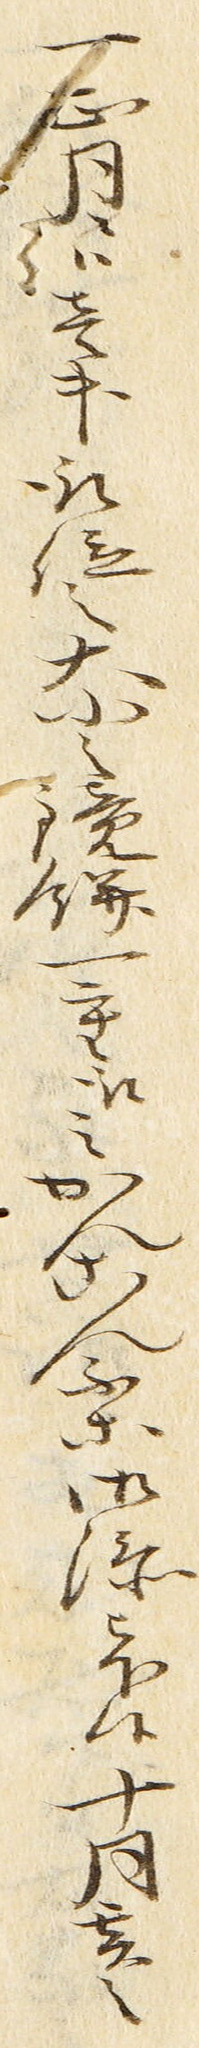一正月には一升取位之大小之鏡餅一重取みかんこんふ等御添被下候十月亥之
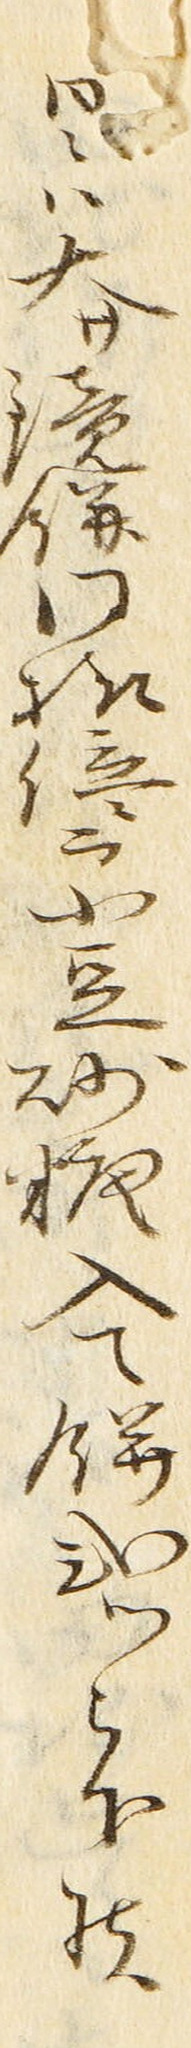日には大け鏡餅同様位に而小豆砂糖入て餅弐ツ被下候
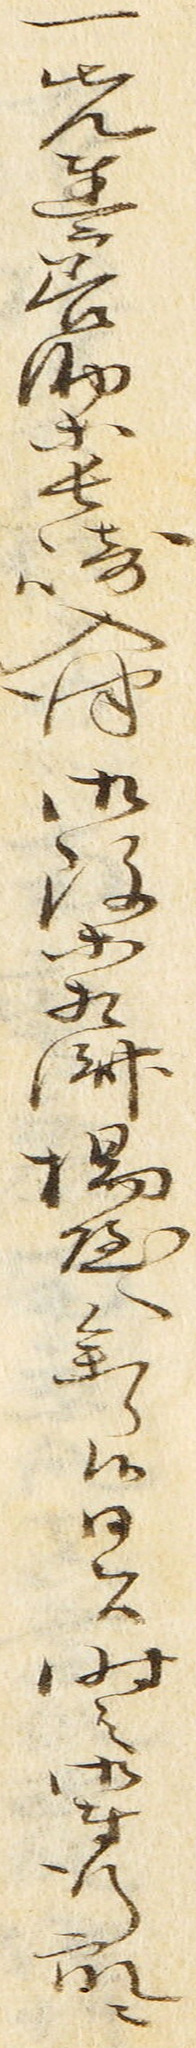一先達而善助等長崎入津御改等相済揚屋へ参り候日は時の御奉行衆に
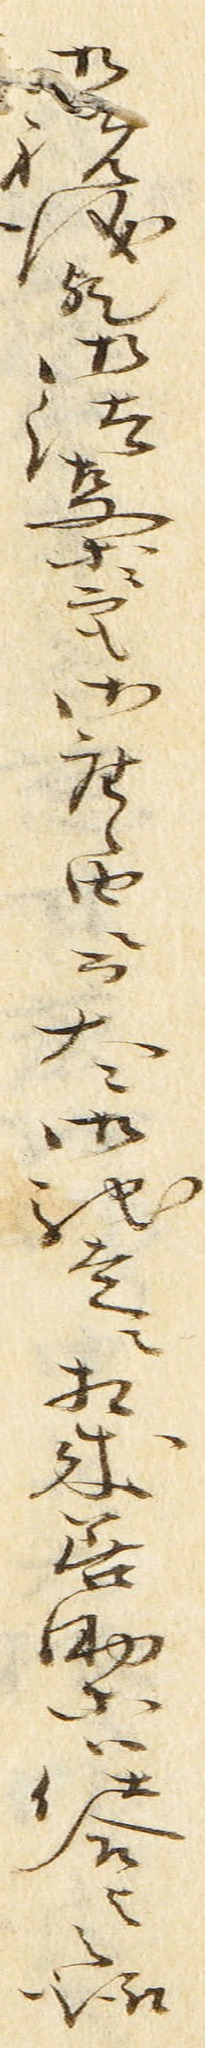御祝儀宛御法事等に而も御座候由に而大に御馳走相来善助等は仕合と之様
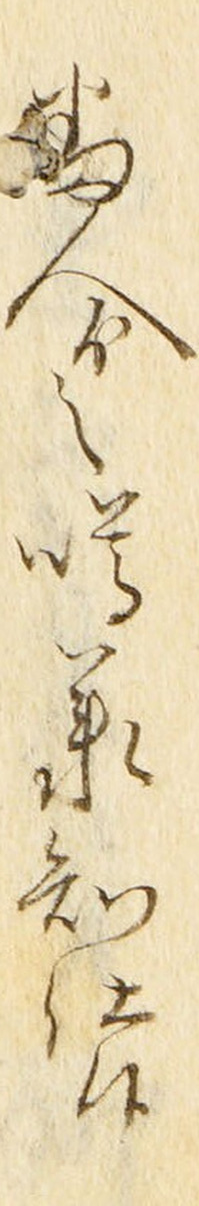当人ゟ之噂承知仕候
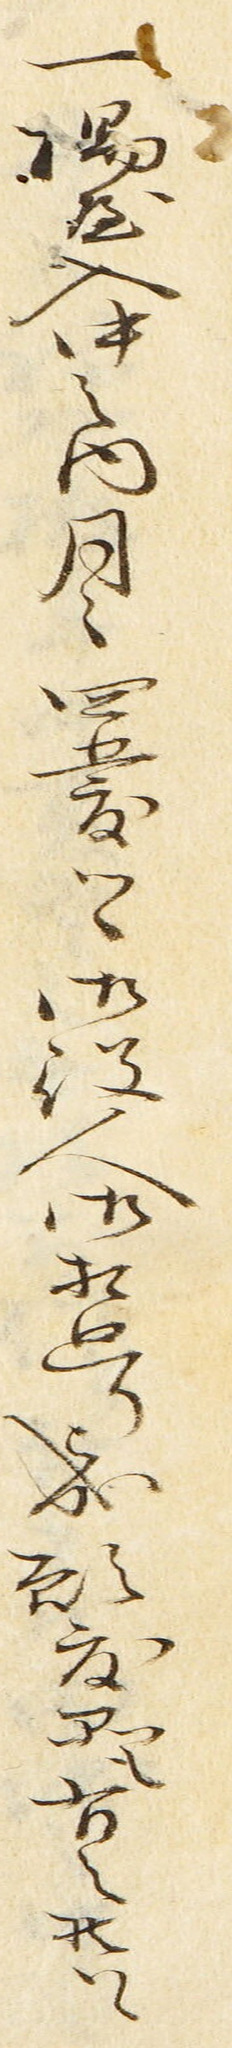一揚屋入中之内月々四五どづつ御役人御相廻り被成願度品も有之候はは
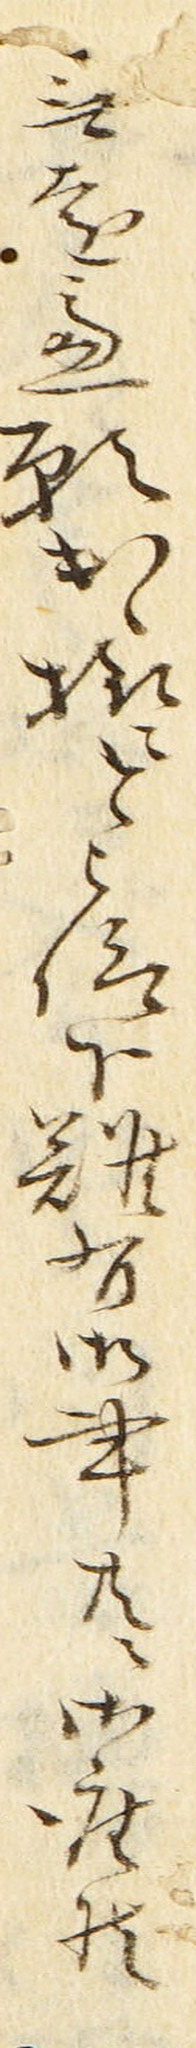無遠慮出候様にと被仰下難有御事共に御座候

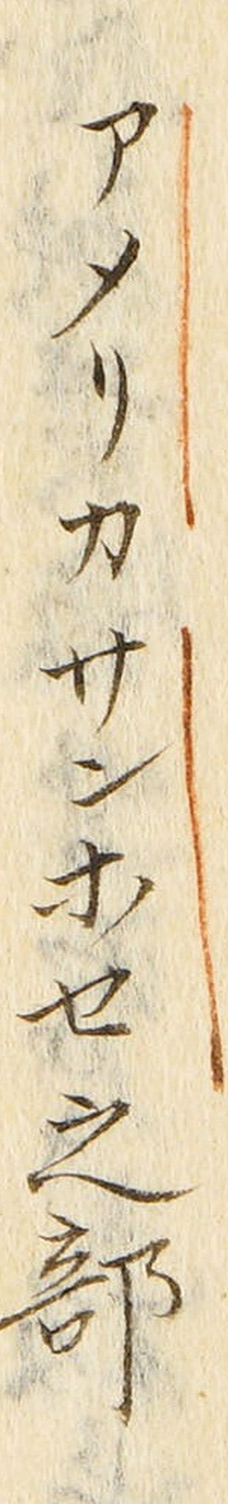アメリカサンホセ之部
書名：漂流人弥市之記
